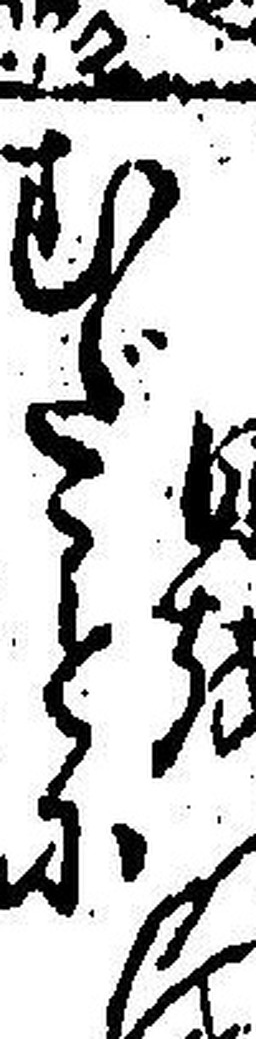むだことに
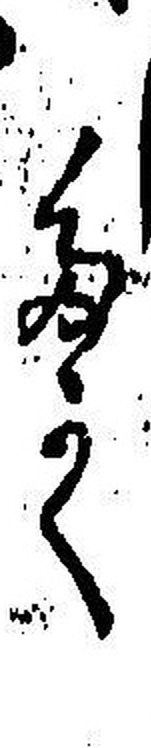たかく
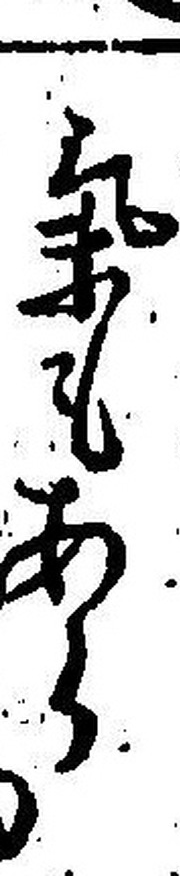気もあら
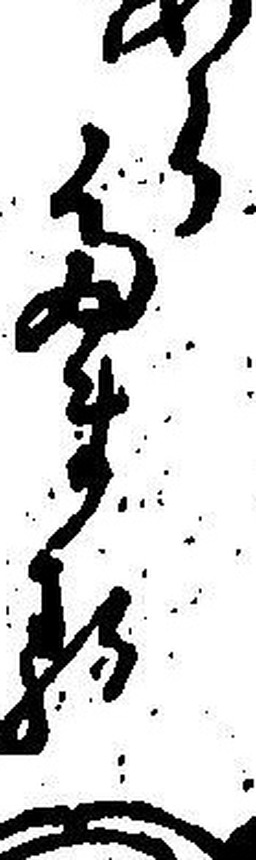たまる
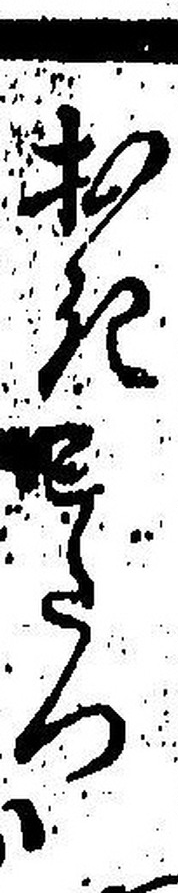おきこたつ
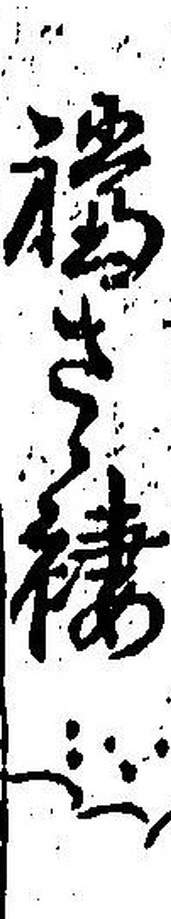襠さら褄
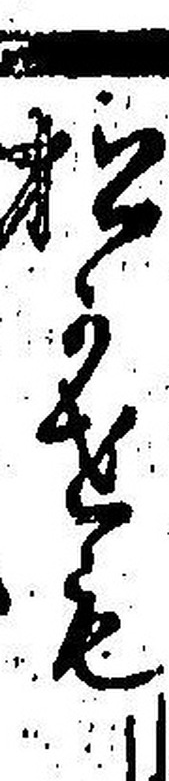松かせも
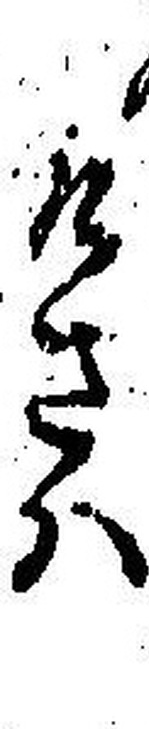けさは
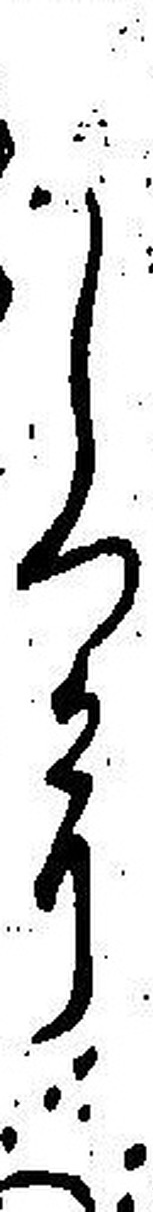しつかに
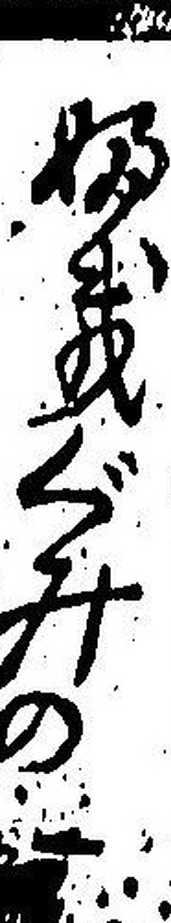ふきぐみの
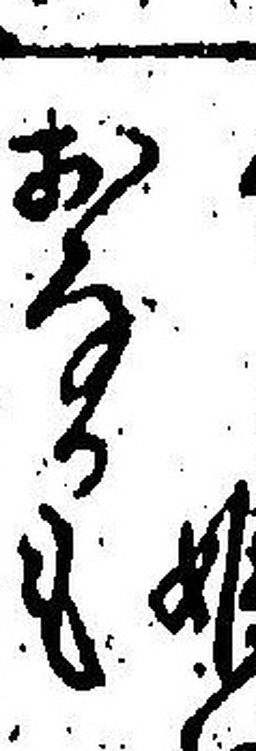おなかも
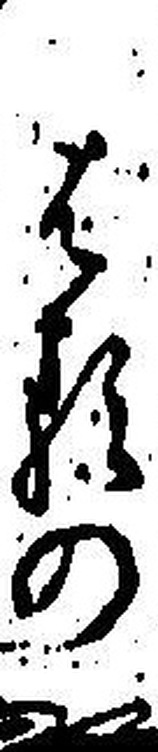はるの
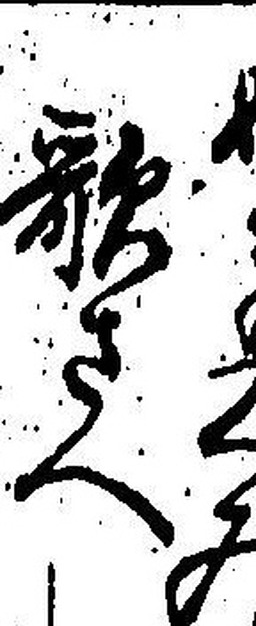歌さへ
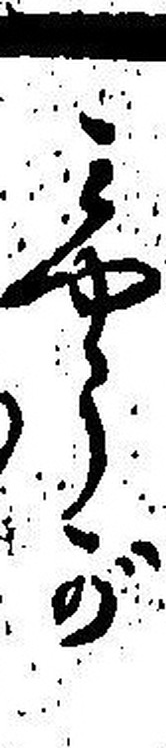みやうが
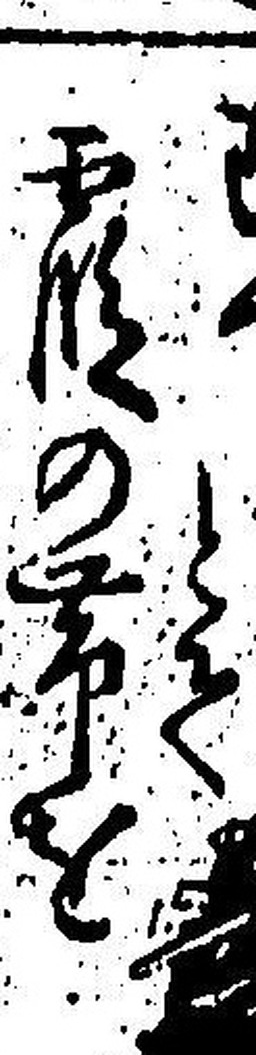霞の帯を
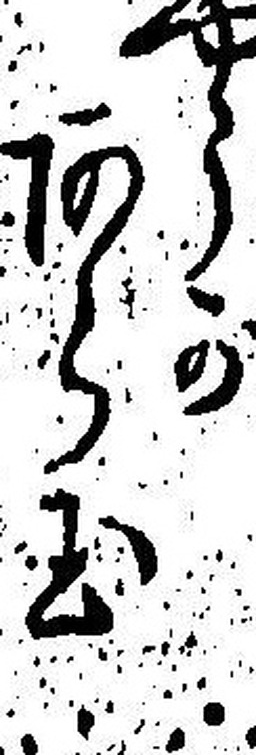あら玉
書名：どうれ百人一首 / 鹿都部真顔(狂歌堂)編
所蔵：東京大学総合図書館 General Library in the University of Tokyo, JAPAN
